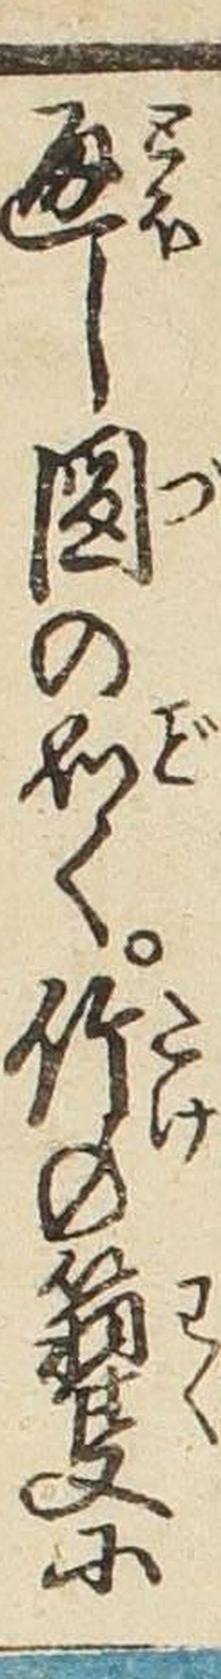通し図の如く。竹の籆に

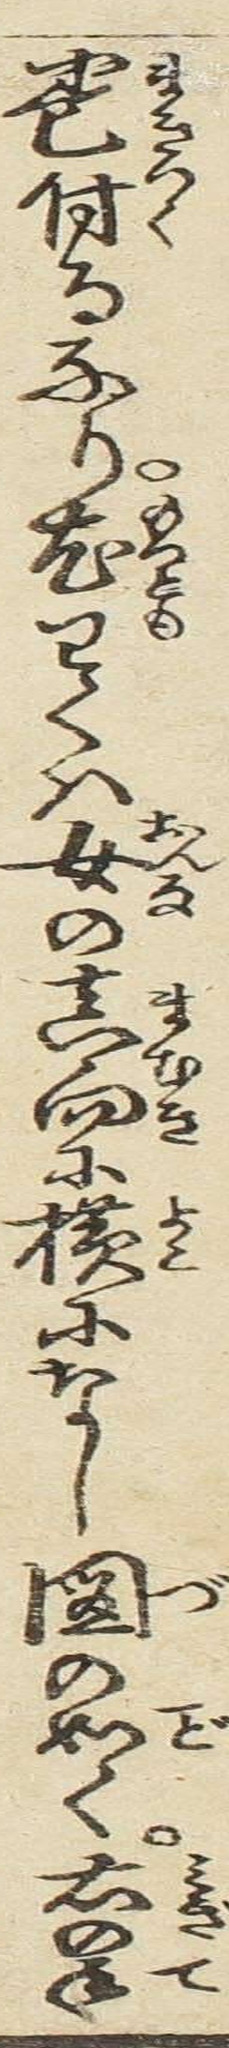巻付るなり。尤わくは女の真向に横になし図の如く。右の手
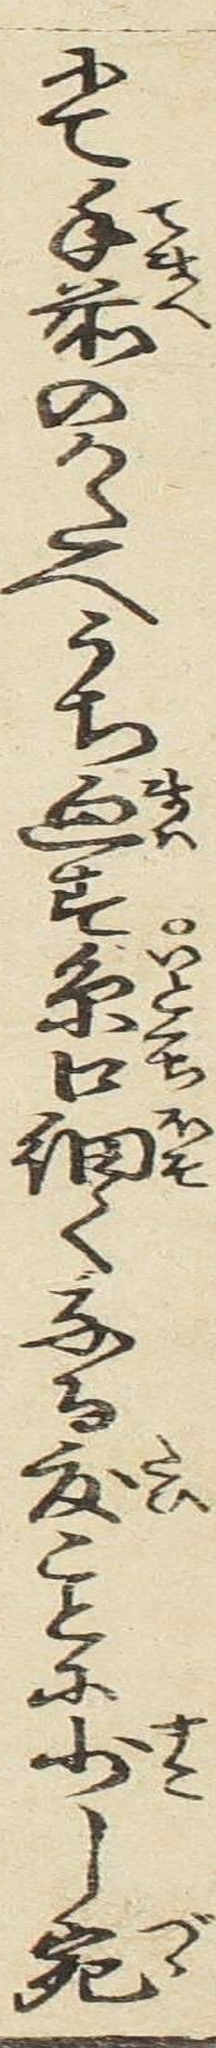にて手前のかたへうち廻す。糸口細くなる度ことに少し宛
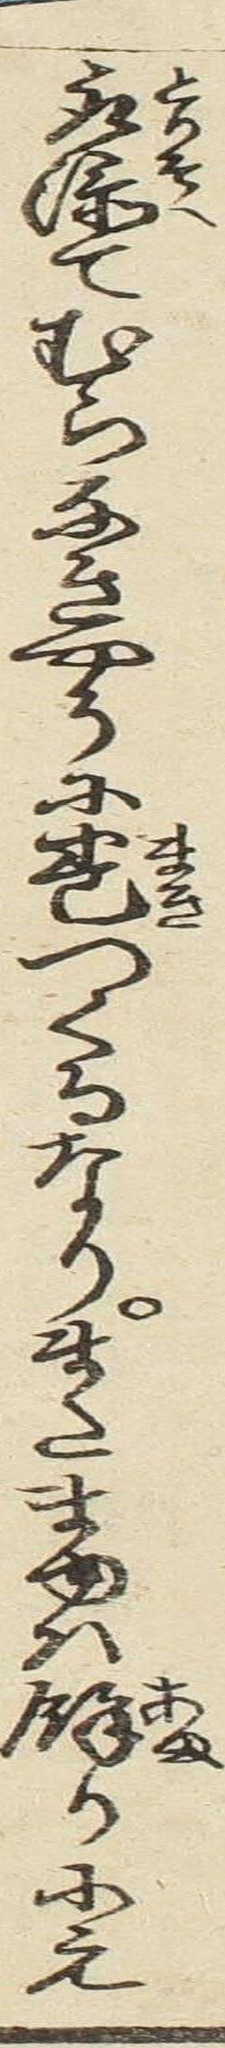取添てむらなきやうに巻つくるなり。またまゆは餘りにえ
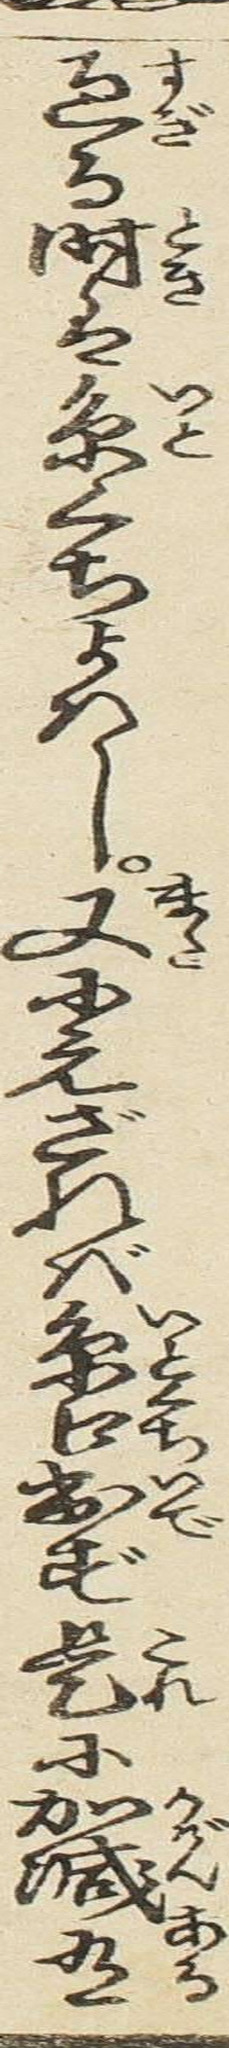過る時は糸くちよはし。又にえざれば糸口出ず是に加減有
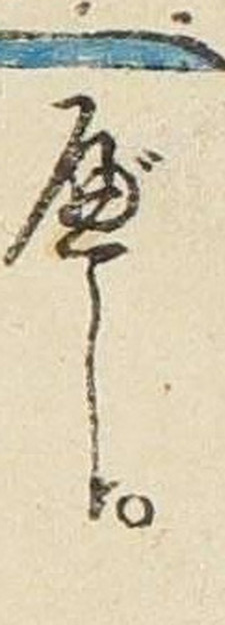べし。
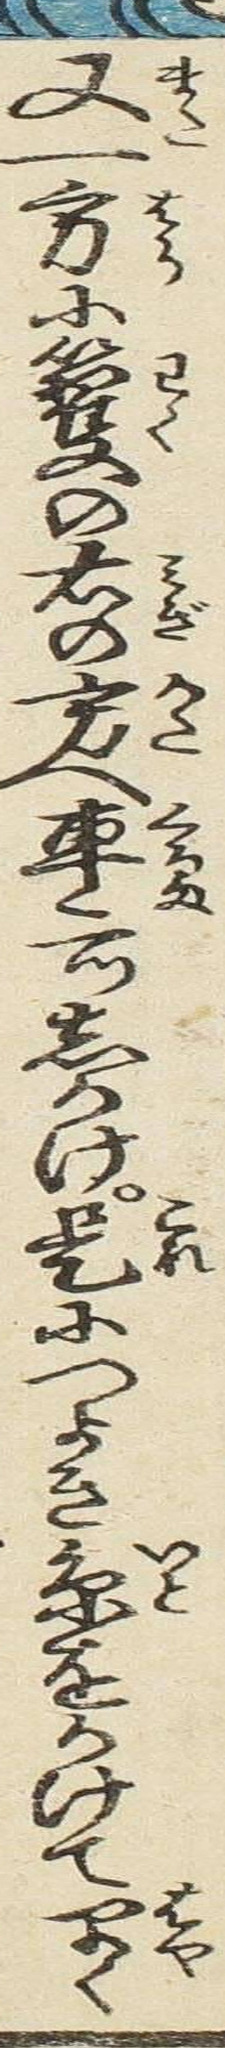又一方に籆の右の方へ車二ッしかけ。是につよき糸をかけて早く
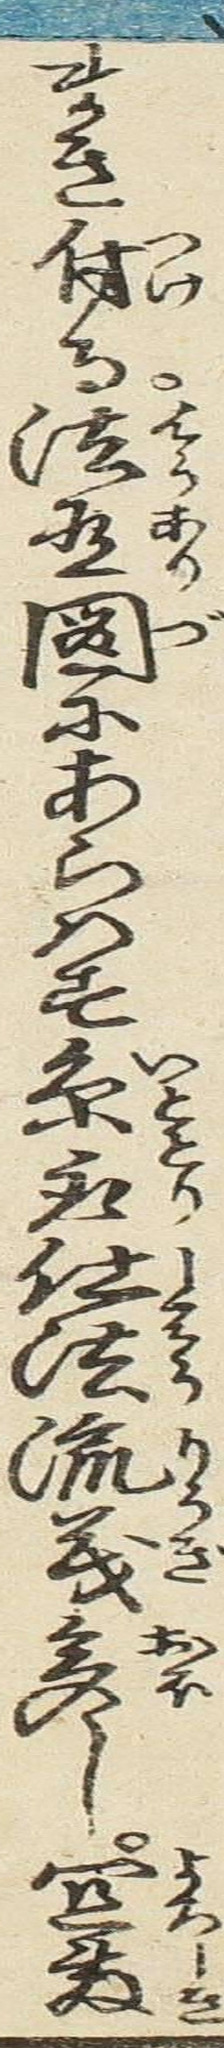まき付る。法有図にあらわす糸取仕法流義多し。宜敷
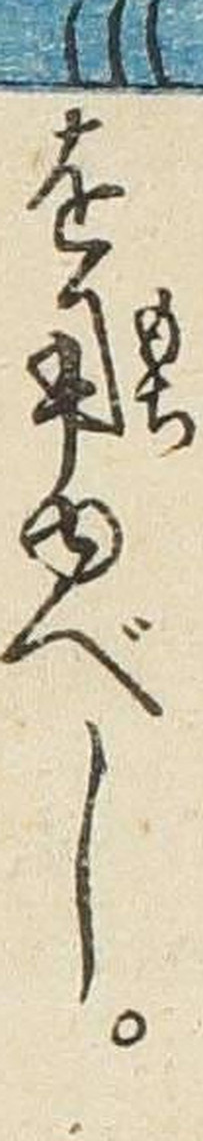を用ゆべし。
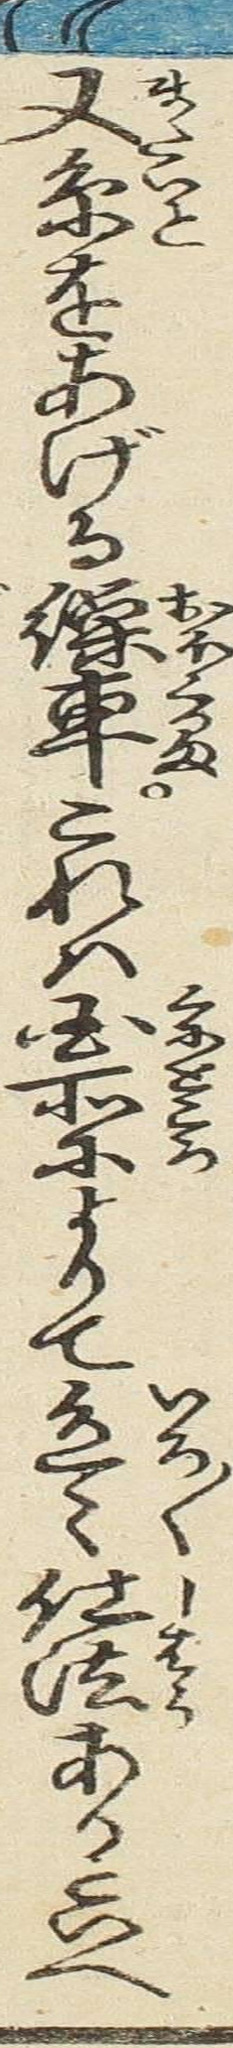又糸をあげる繰車。これは国所によりて色々仕法ありといへ
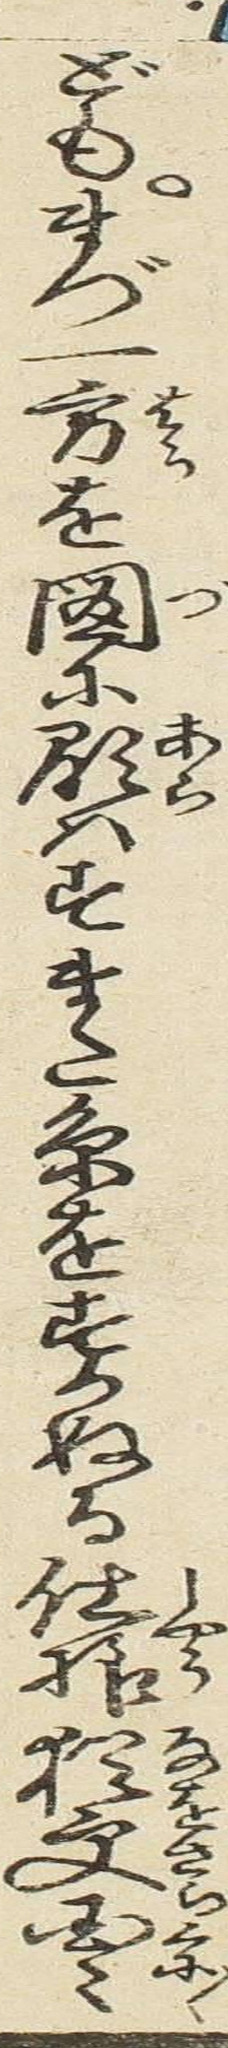ども。まづ一方を図に顕はすまた糸をすかぬる仕様猶更国々
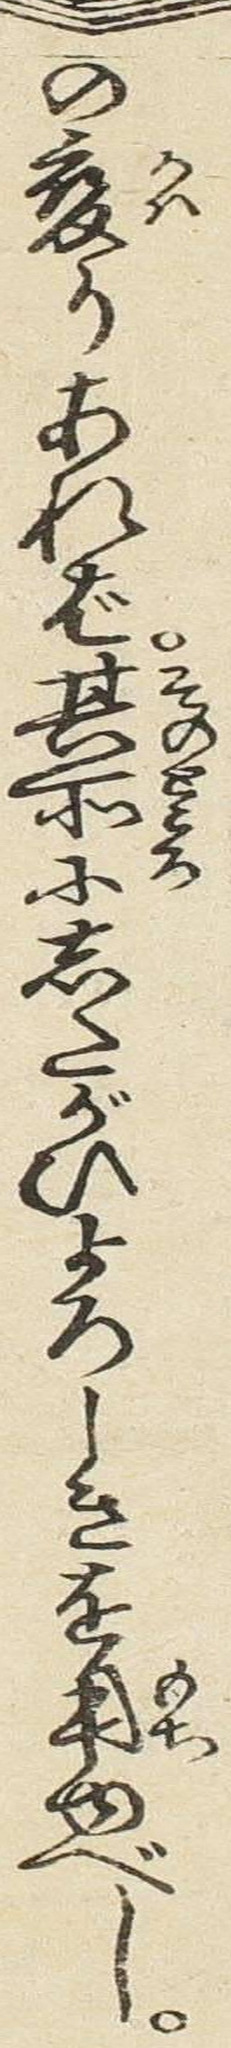の変りあれば。其所にしたがひよろしきを用ゆべし。
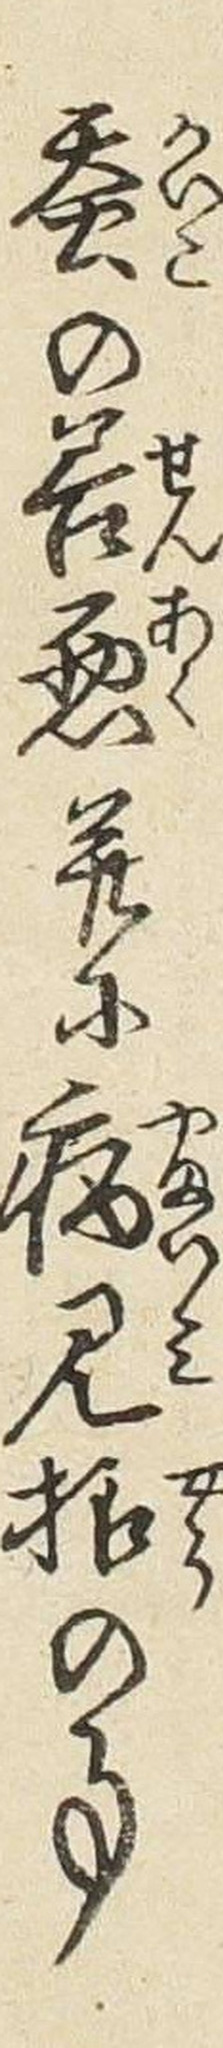蚕の善悪並に病見様の事
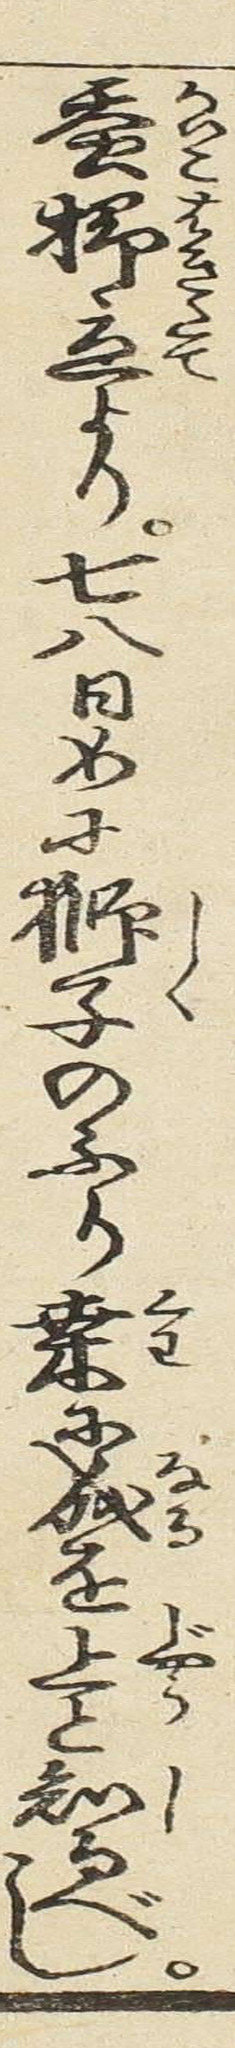蚕掃立より。七八日めに獅子のふり桑に成を上と知るべし。
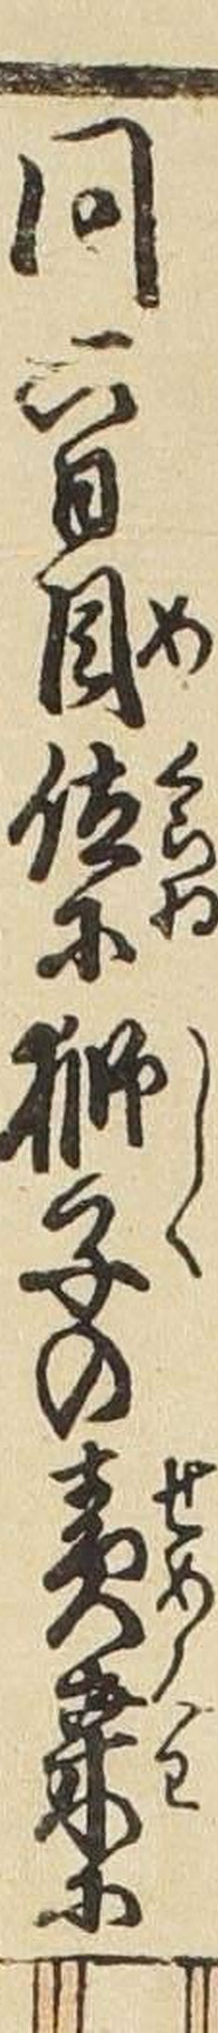同六日目位に獅子の責桑に
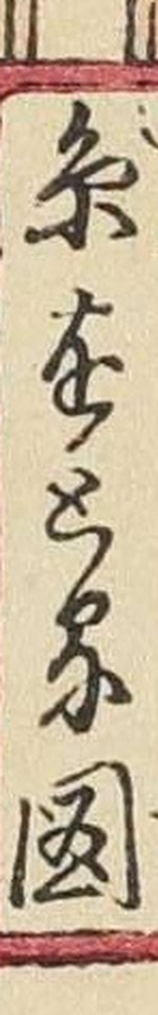糸をとる図
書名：養蠶圖解
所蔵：東京大学農学生命科学図書館 国文学研究資料館
